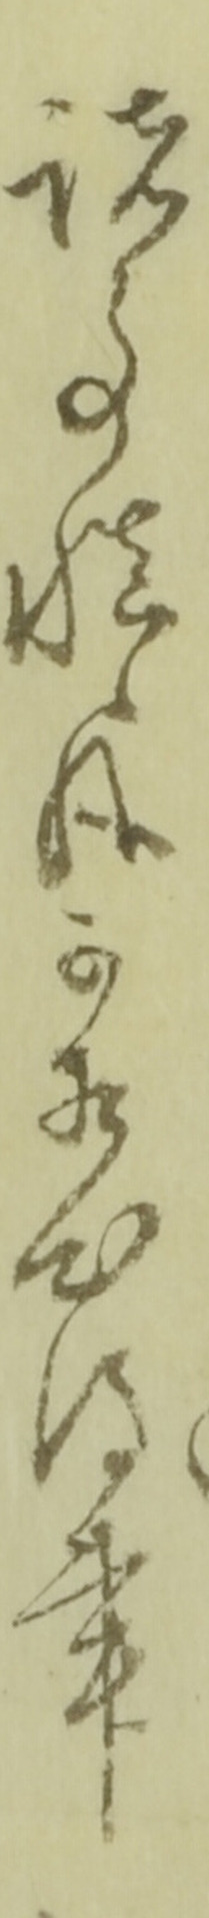諸事慎候様可相心得事
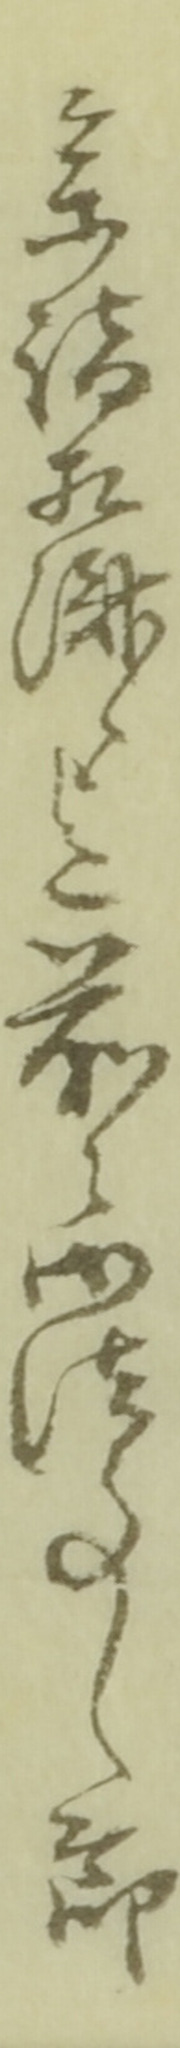参詣相済候迄前々御法事候節
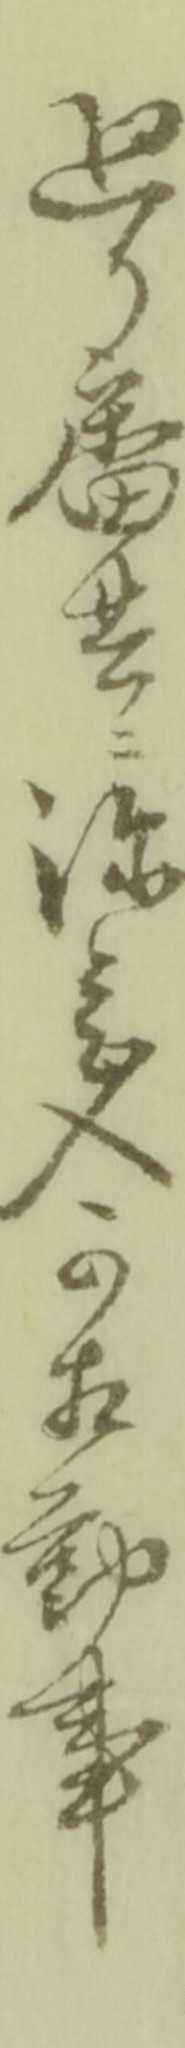廻り番共二弥念入可相勤事
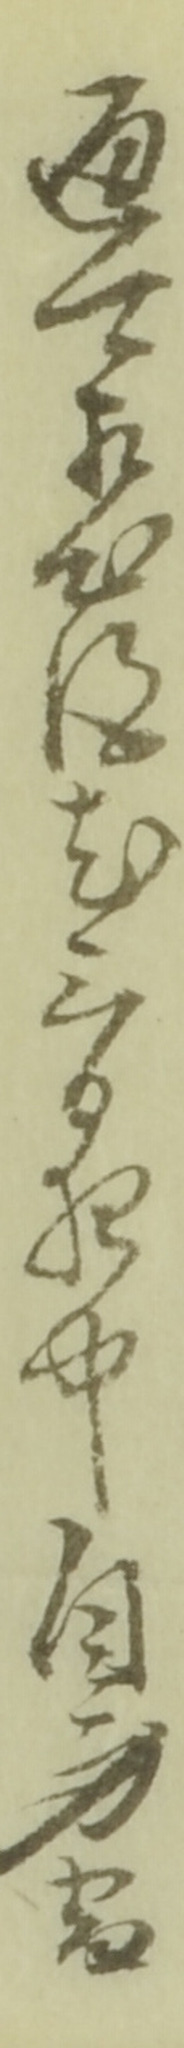通可相心得尤三日夜中自身番
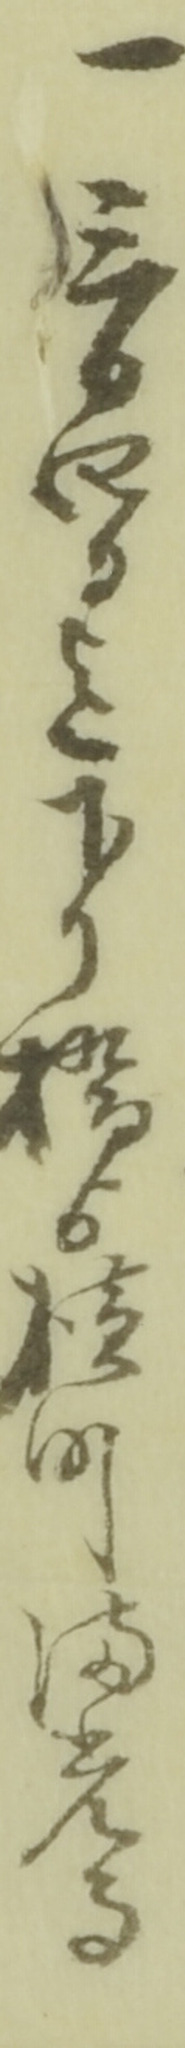一三日四日迄下り橋より横町満光寺
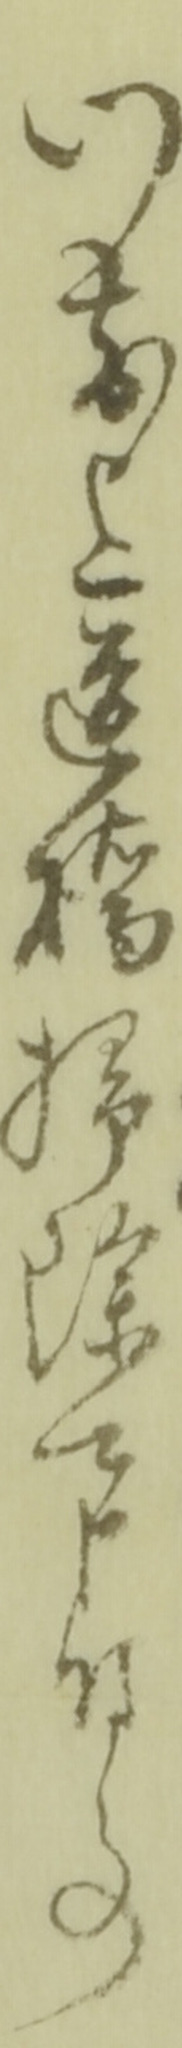門前迄道橋掃除可申付候事
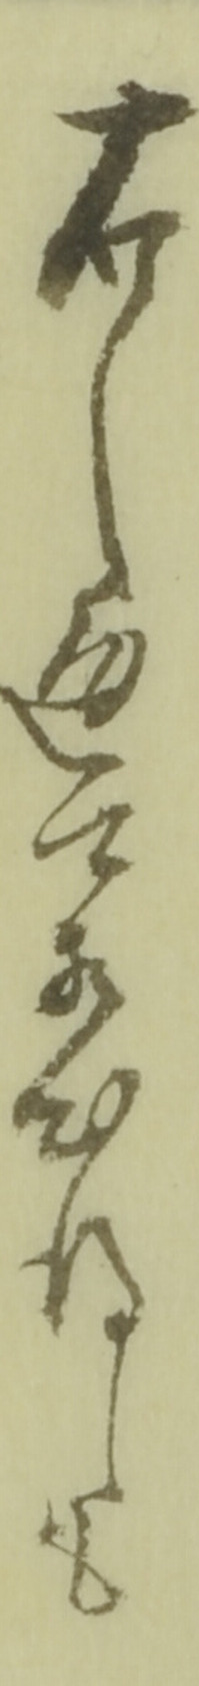右之通可相心得候以上
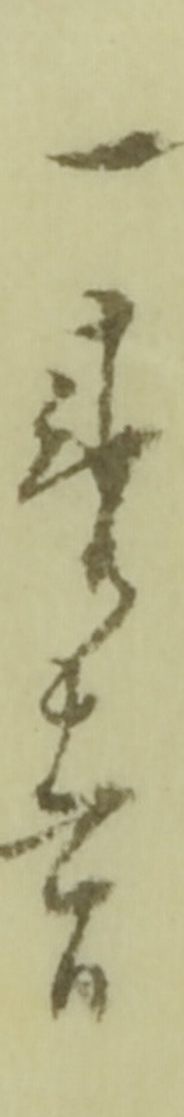一来る十六日
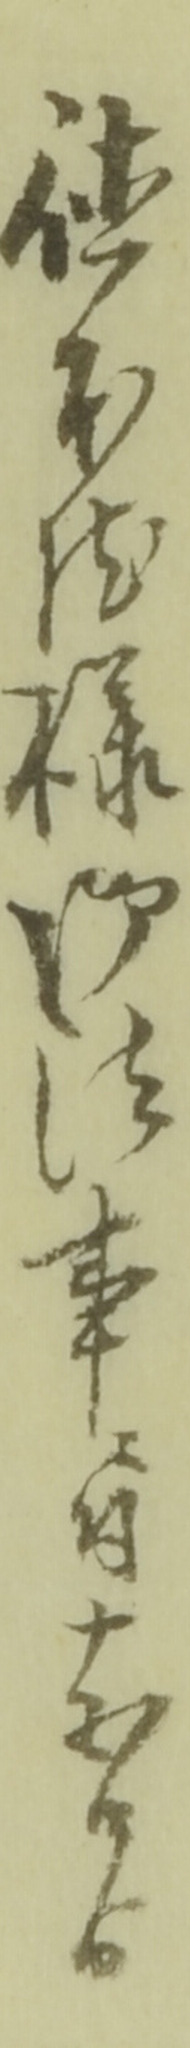徳本院様御法事二付十五日より
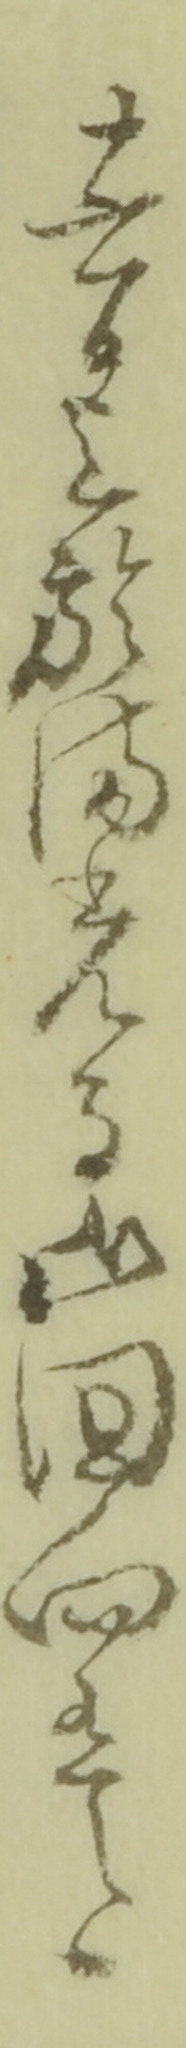十六日迄於満光寺御回向有之候
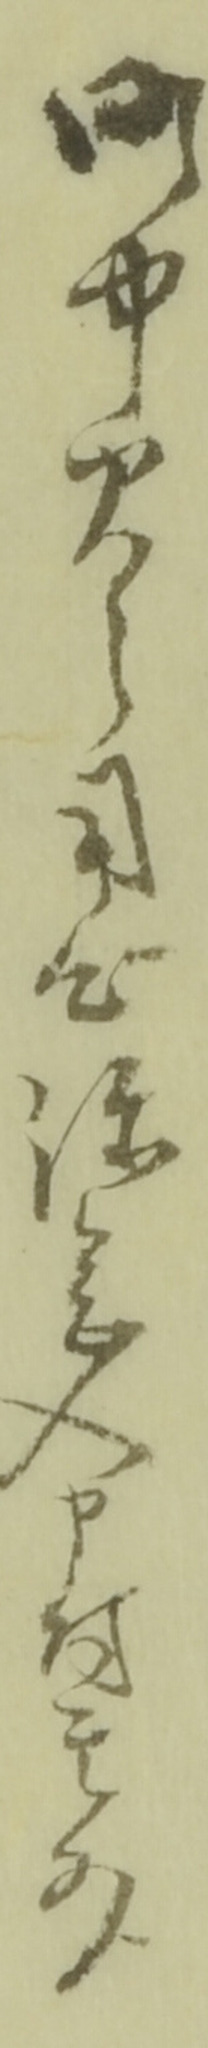町中火之用心弥念入申付其外
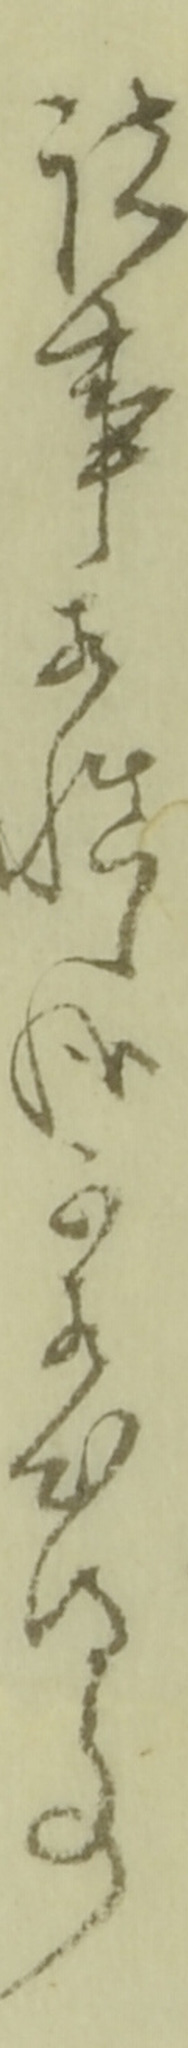諸事相慎候儀可相心得候事

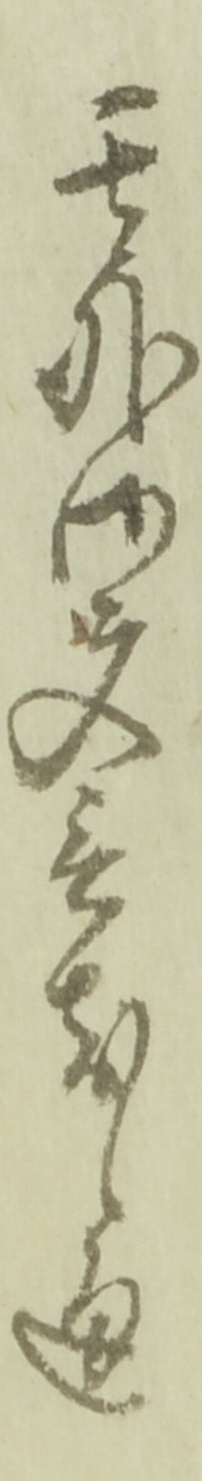其外御文従前之通
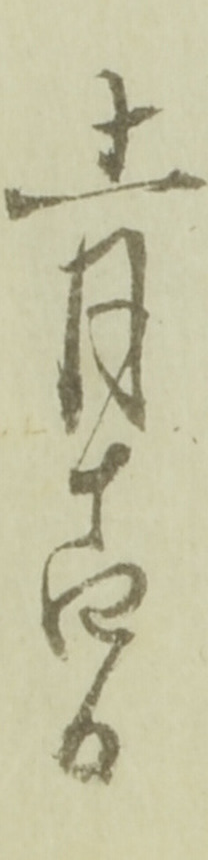十一月十四日
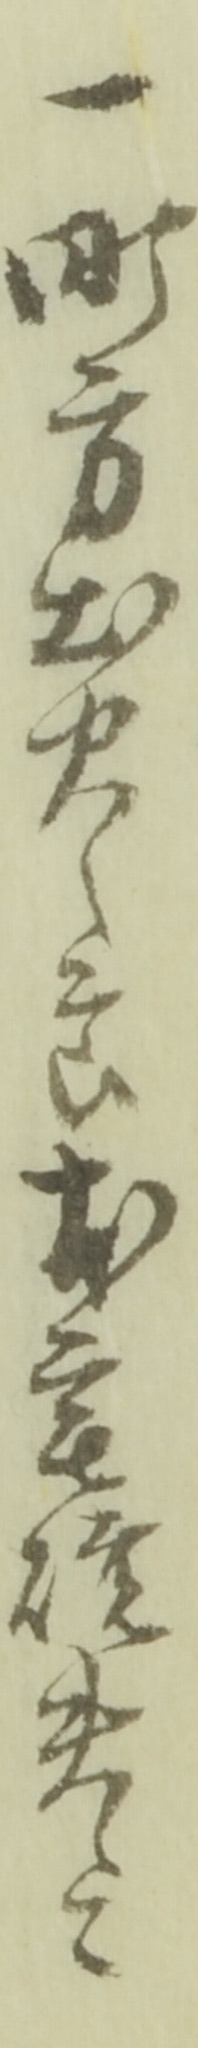一町方出火之節本宅焼失候て
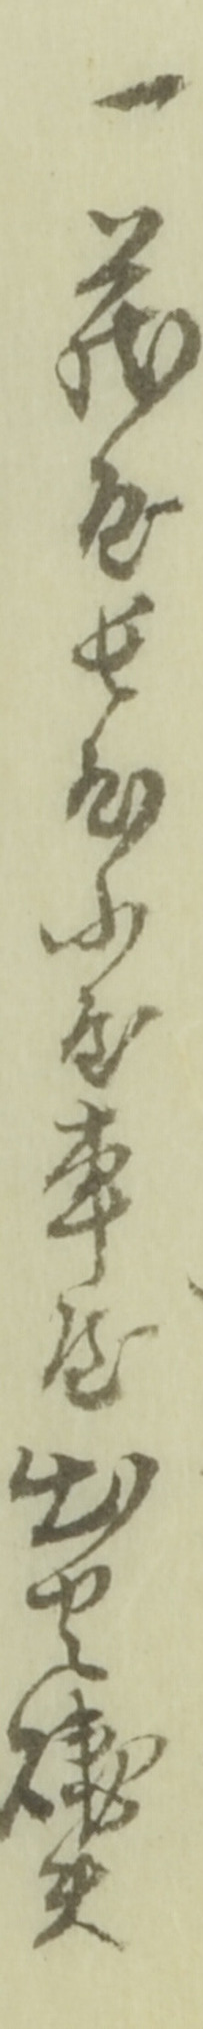一蔵屋長屋小屋車屋出火焼失
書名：御公儀様御領主様御触書控
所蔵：伊那市立高遠町図書館・合同会社AMANE
